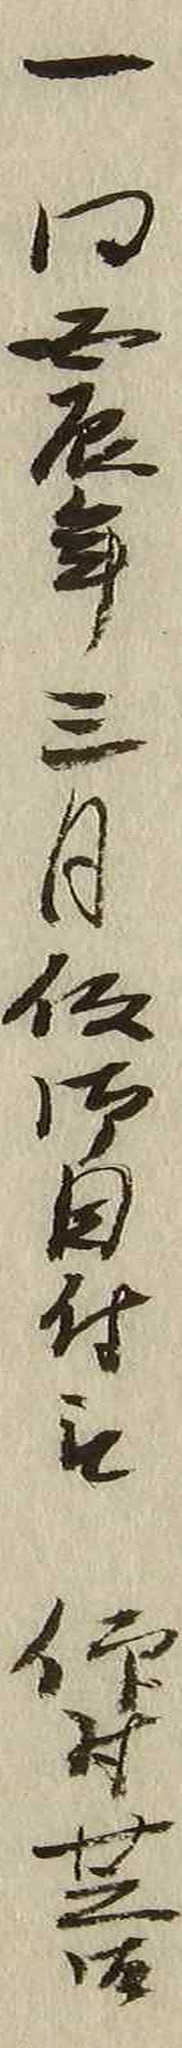一同五辰年三月仮御目付被仰付芝御
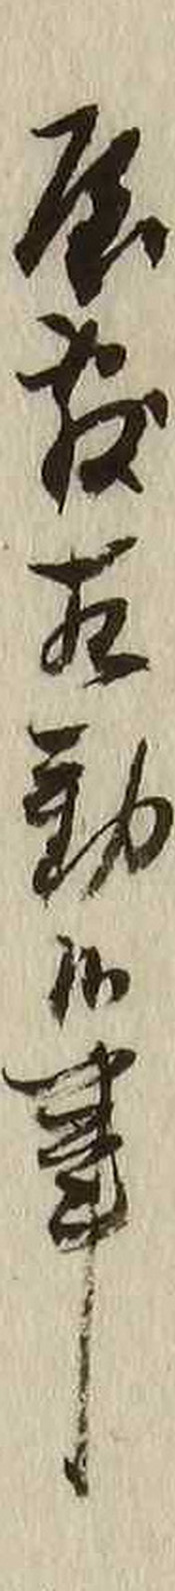屋敷相勤候事
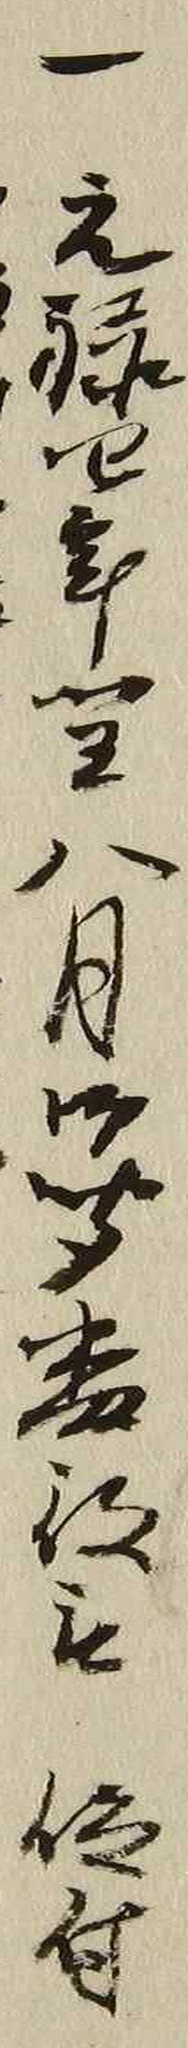一元禄四年閏八月御聞番役被位付
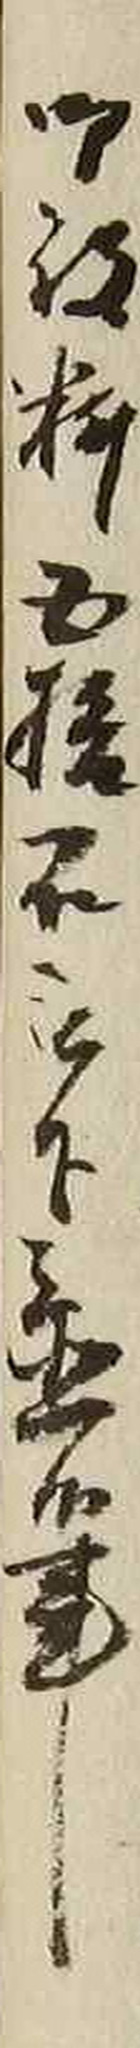御役料五拾石被下置候事
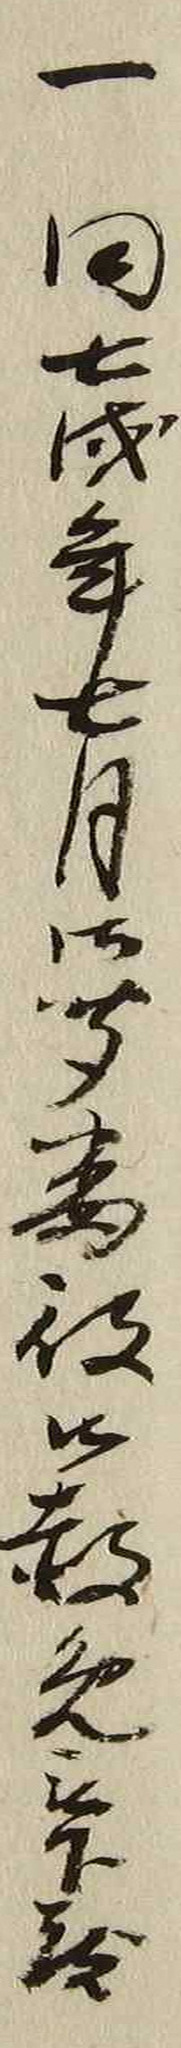一同七戌年七月御聞番役御赦免被下度
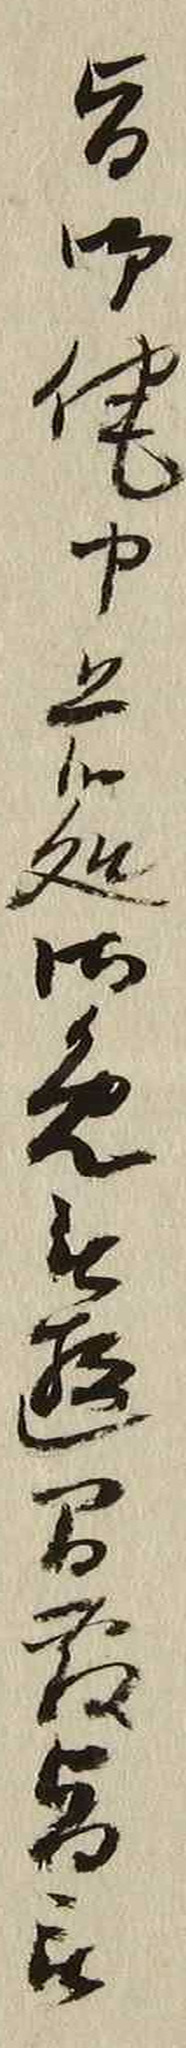旨御侘申上候処御免被遊間敷旨被
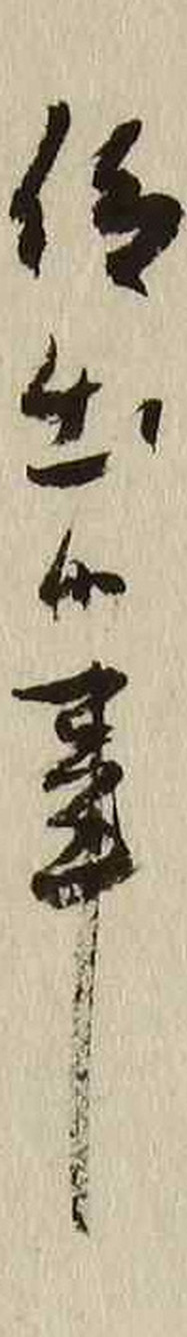仰出候事
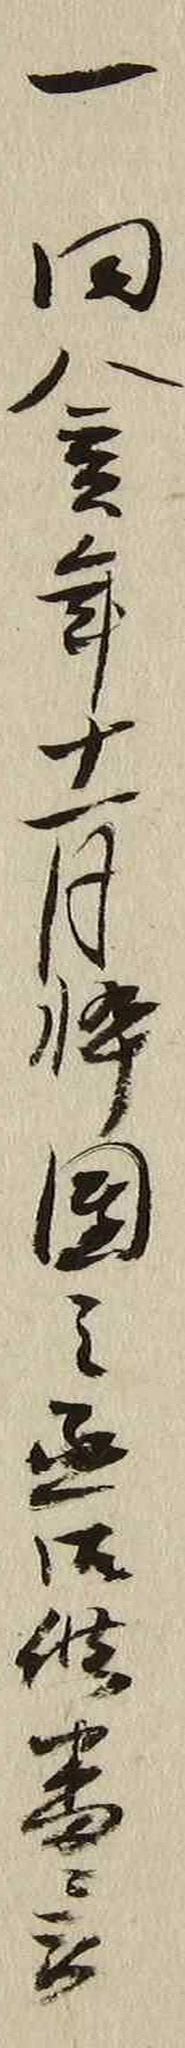一同八亥年十一月忰国之丞御供番ニ被
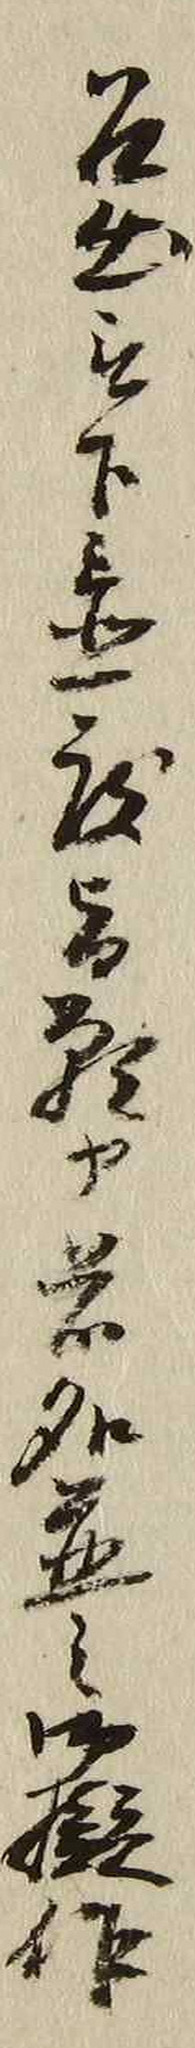召出被下置度旨願申上候処並之御凝作
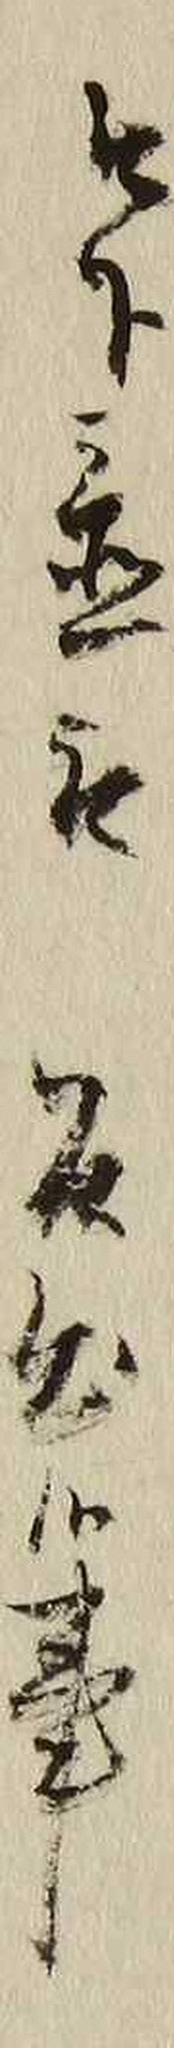被下置被召出候事
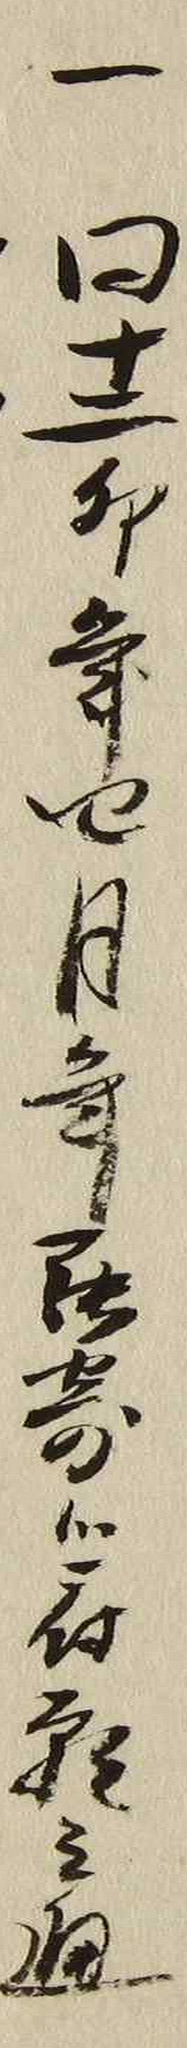一同十二卯年四月年罷寄候ニ付願之通
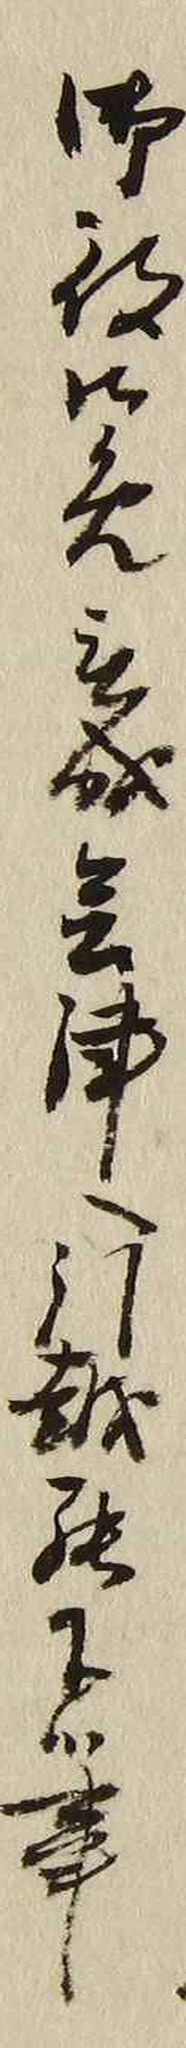御役御免被成会津へ引越罷下候事
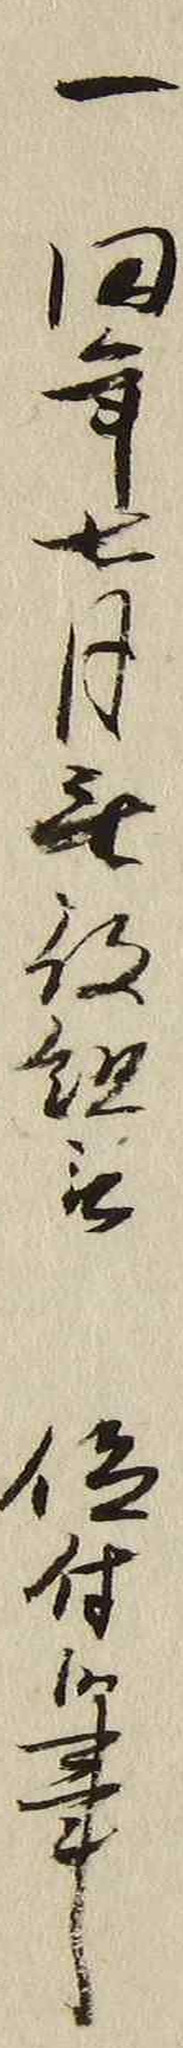一同年七月無役組被仰付候事
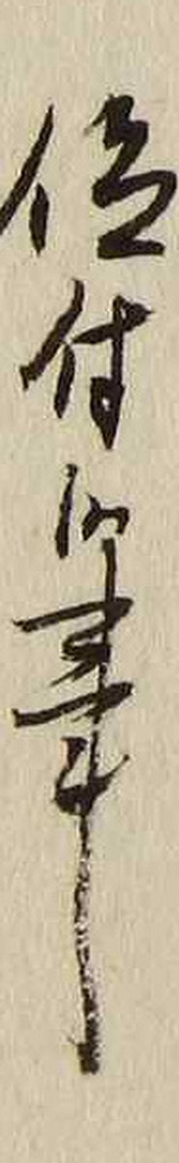仰出候事
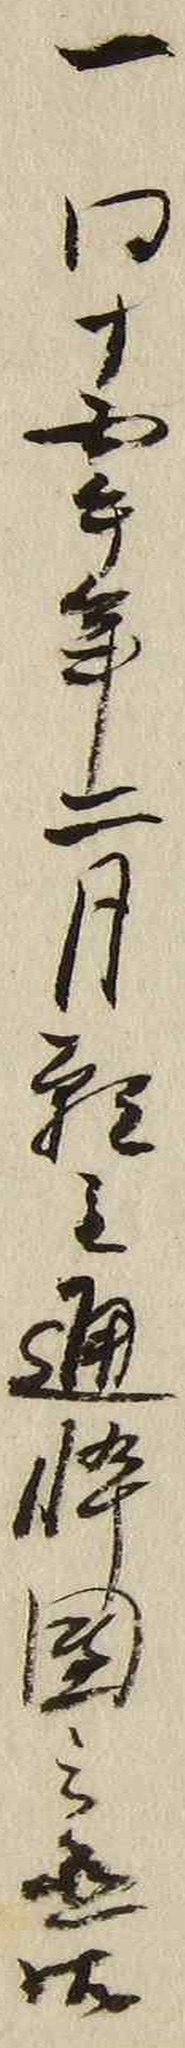一同十五午年二月願之通忰国之丞御

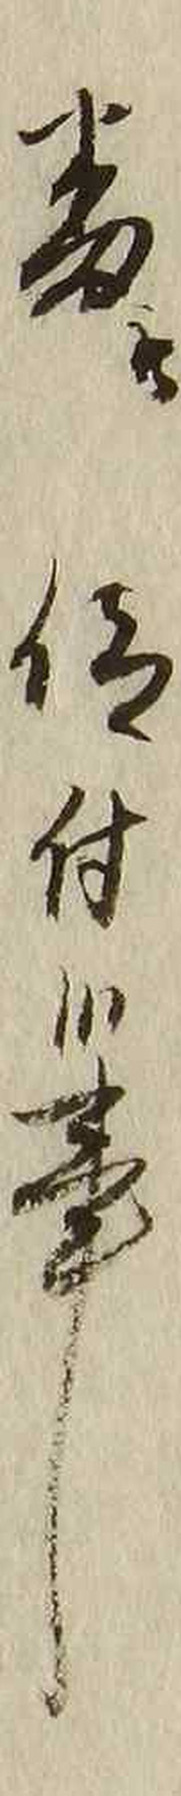番被仰付候事
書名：諸士系譜　巻之345　も之部1
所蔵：会津若松市立会津図書館
